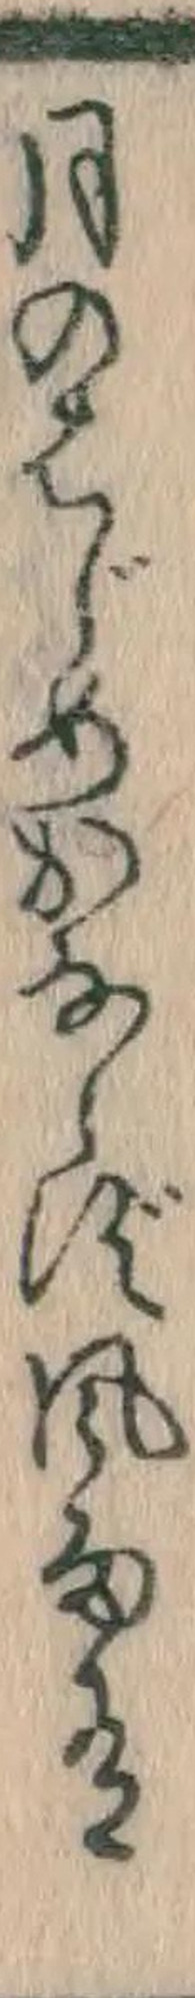月のはじめかならず風雨有
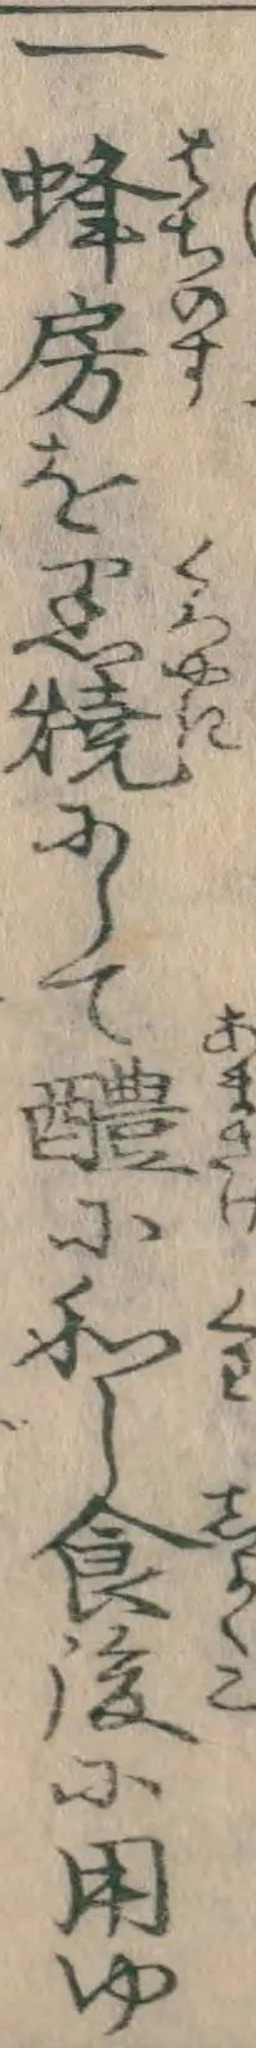一蜂房を黒焼にして醴に和し食後に用ゆ
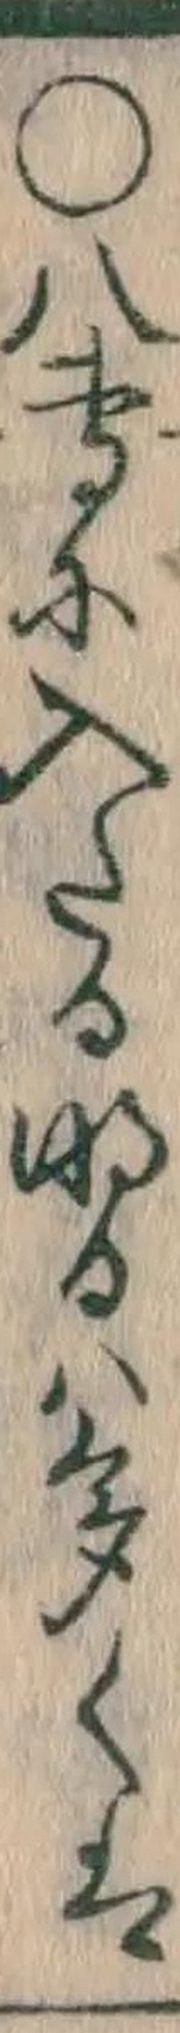○八専に入たる明日は多くは
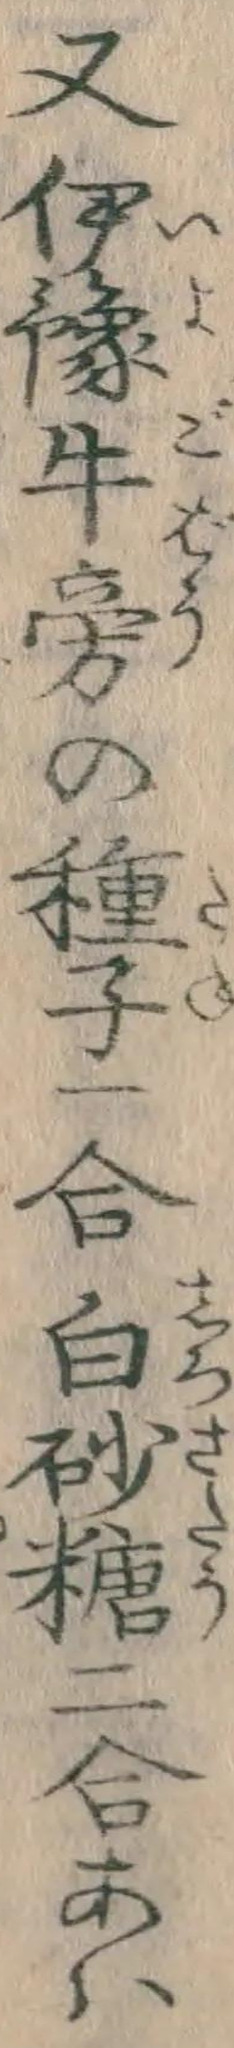又伊予牛旁の種子一合白砂糖二合あは
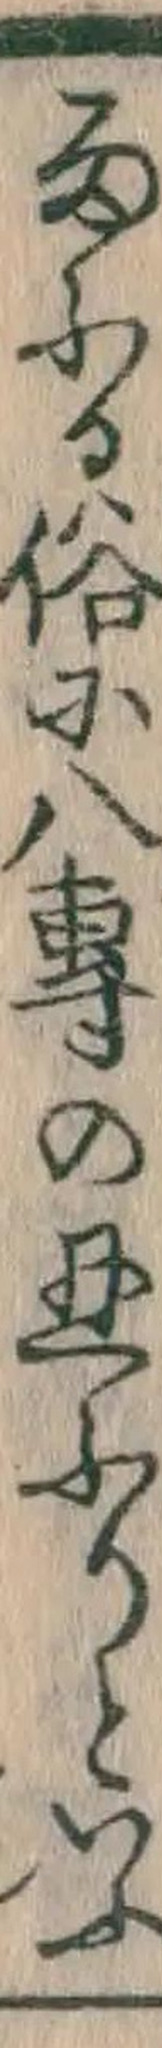雨ふる俗に八専の丑ふりといふ
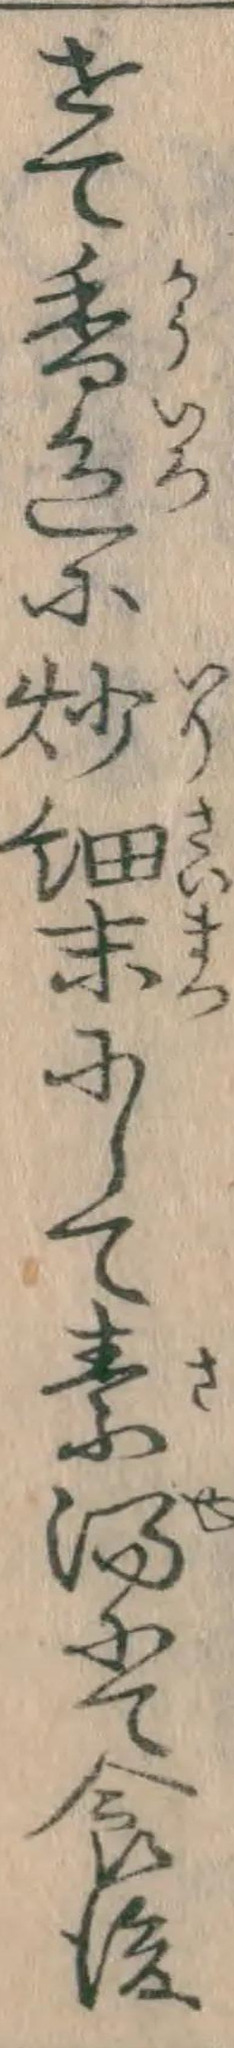せて香色に炒細末にして素湯にて食後
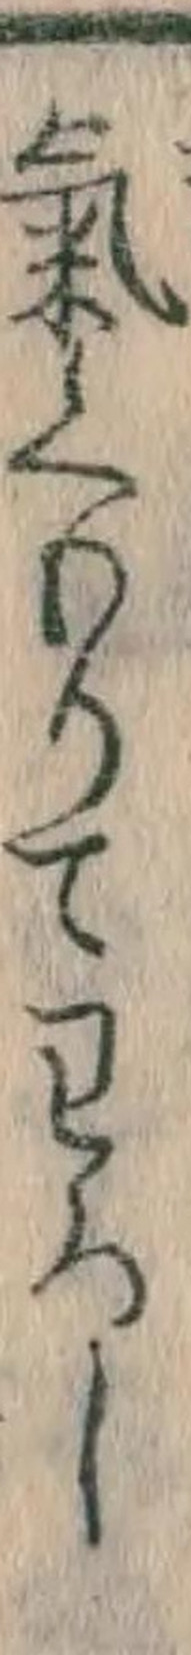気くもりてわろし
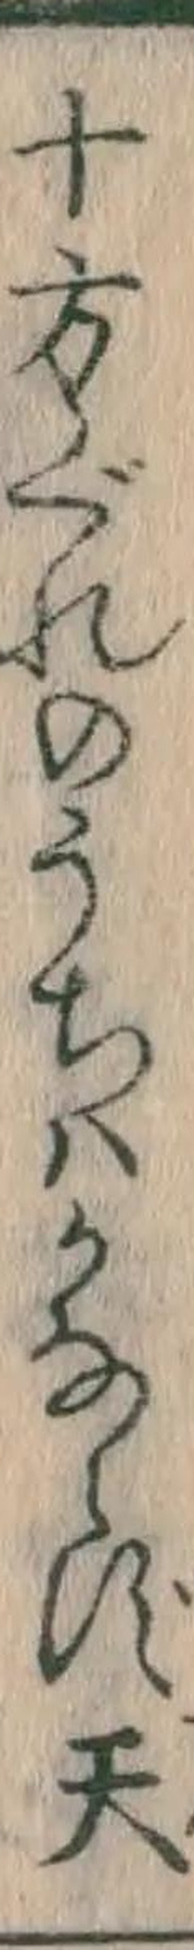十方ぐれのうちはかならず天
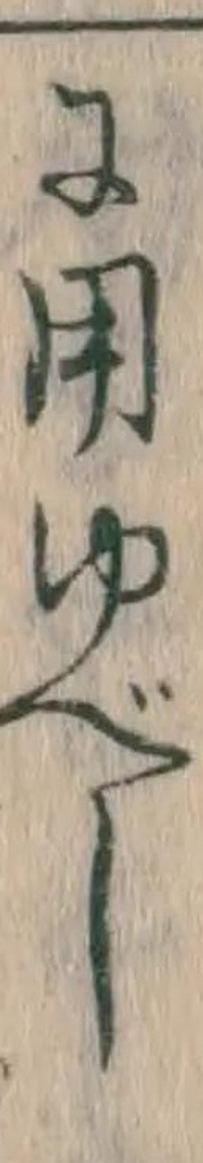に用ゆべし
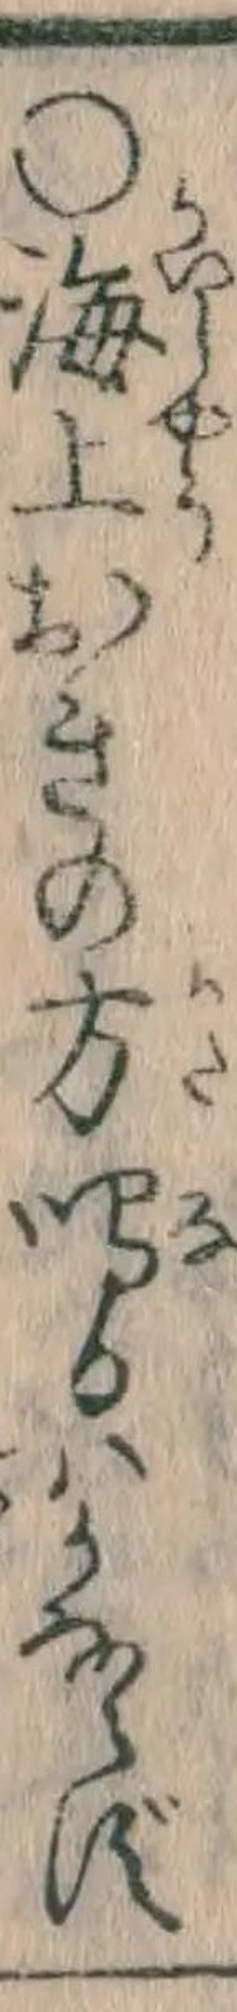○海上おきの方鳴るはかならず
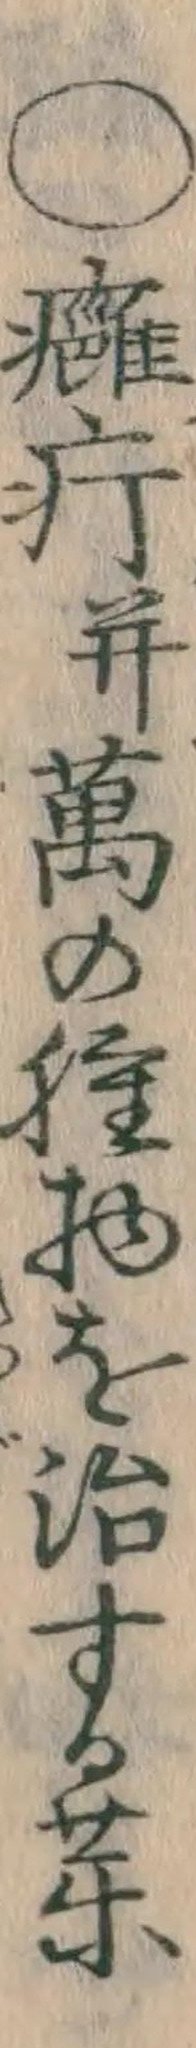○癰疔幷万の腫物を治する薬
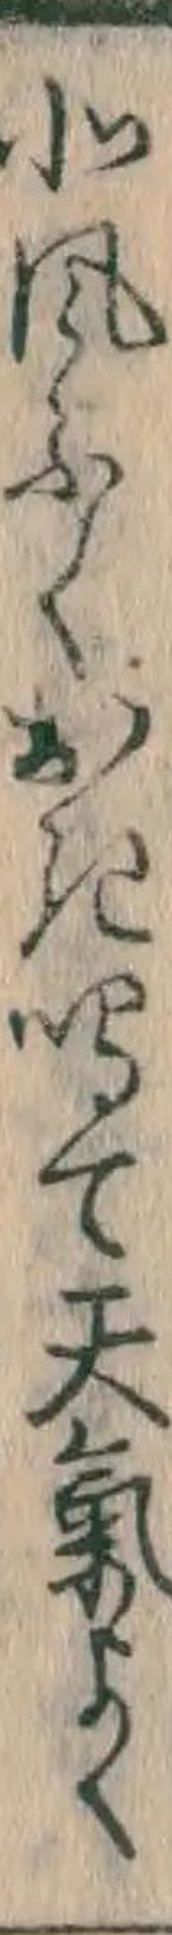北風ふくおき鳴て天気よく
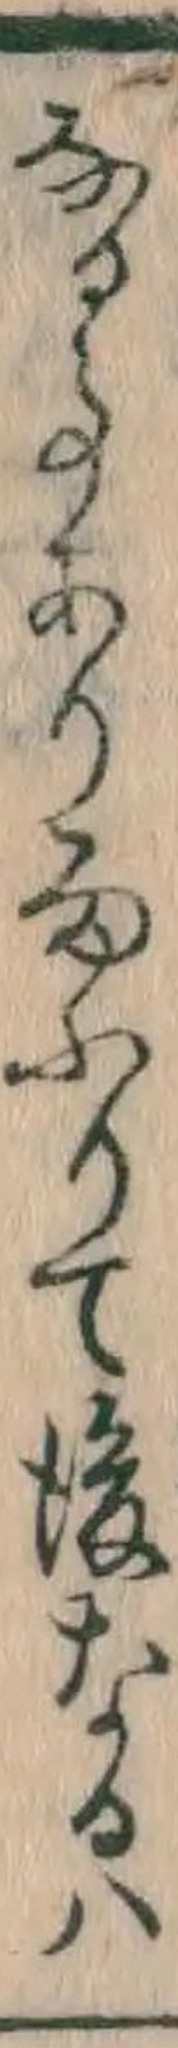なる事あり雨ふりて後なるは
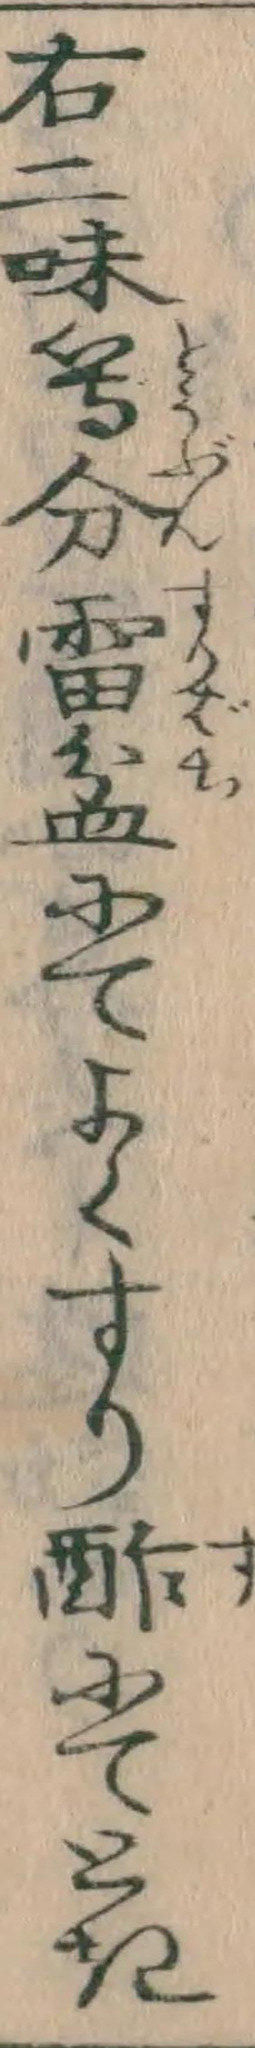右二味等分雷盆にてよくすり酢にてとき
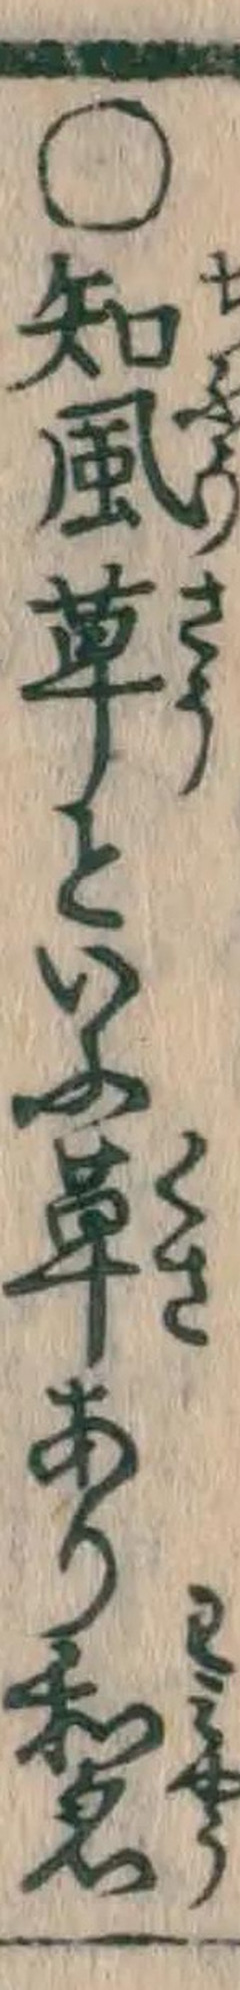○知風草といふ草あり和名
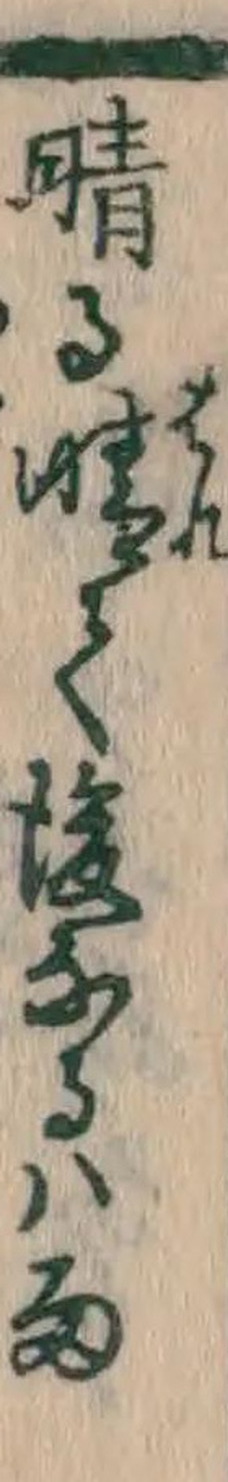晴る晴て後なるは雨
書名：広益秘事大全 3巻. [4]
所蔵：国立国会図書館 National Diet Library, JAPAN
